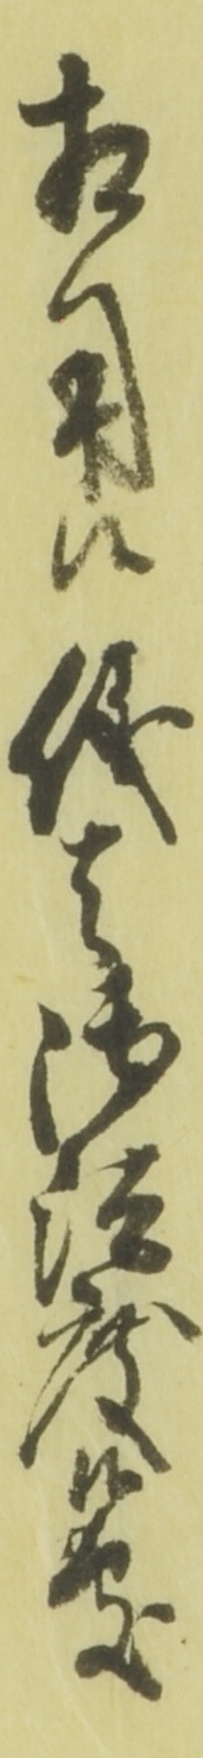相用候儀は御法度候処
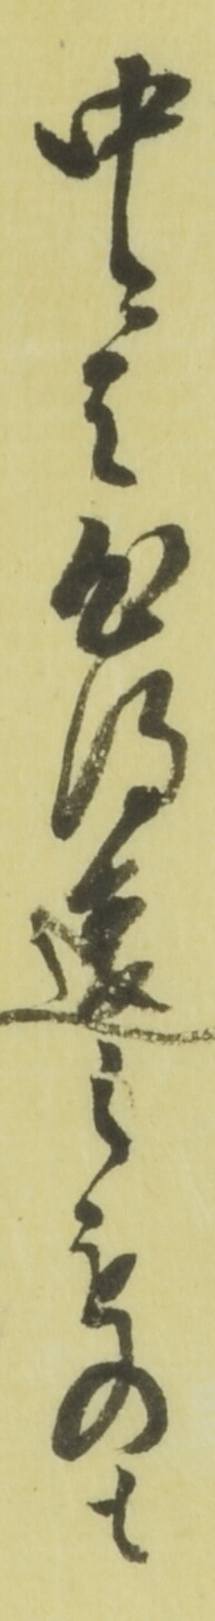中ニは心得違之ものは
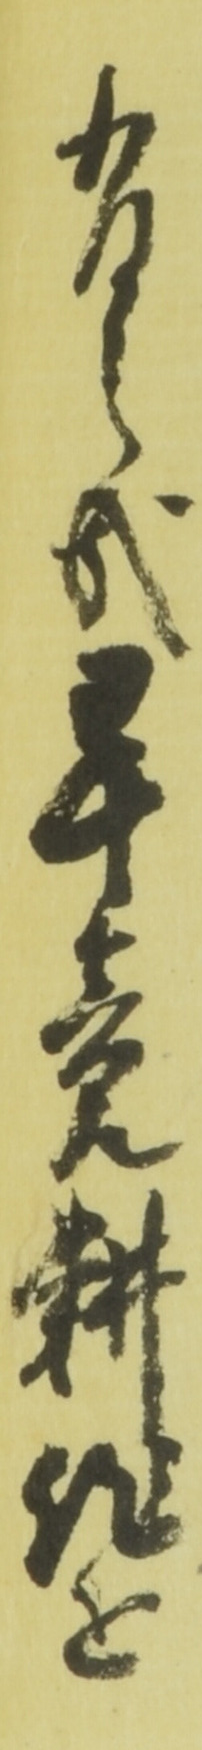有之哉畢竟耕作を
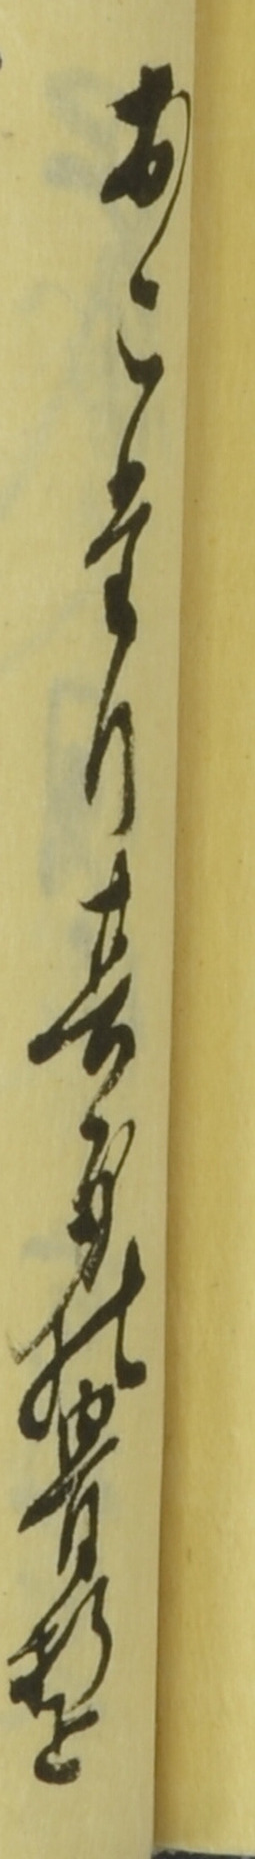おこたり其身の骨折を
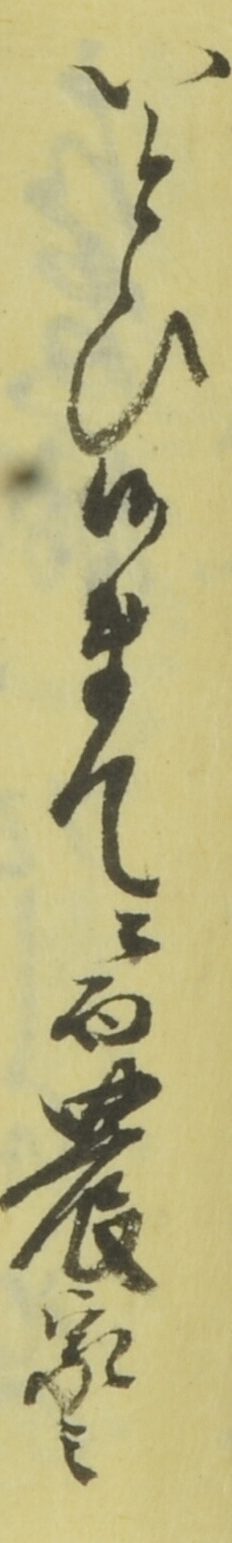いとひ候まてニ而農家之
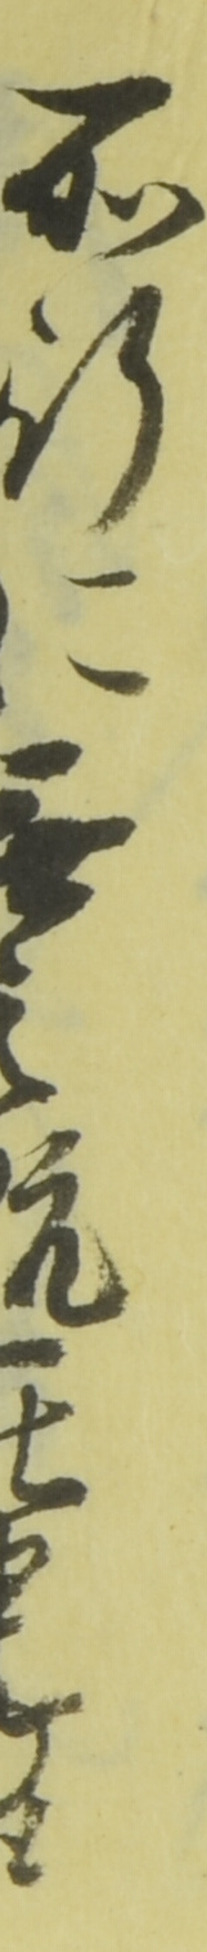所行に無之既一昨申年も

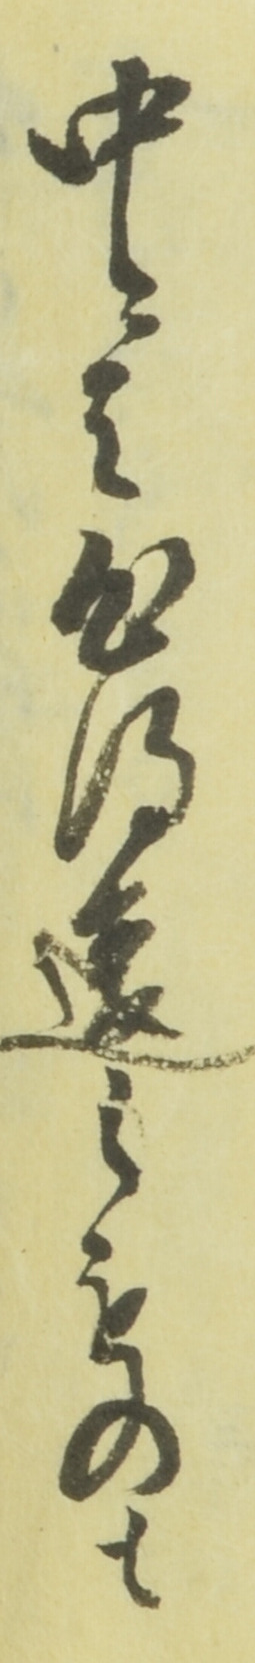中ニは心得違之ものは
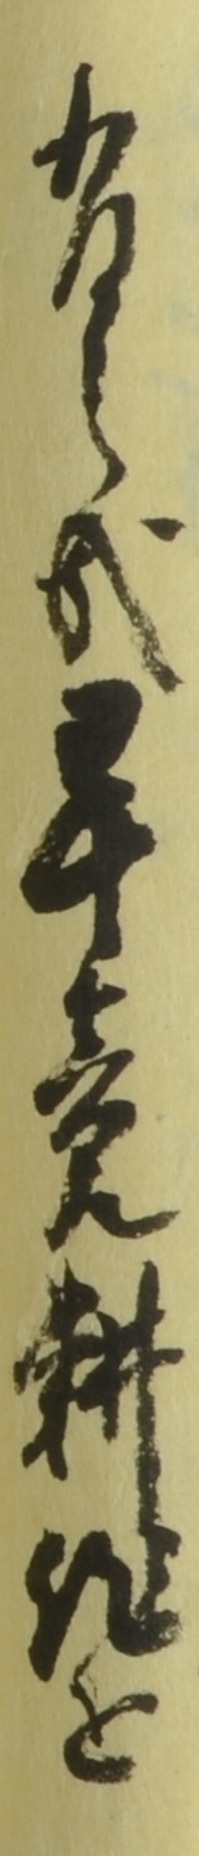有之哉畢竟耕作を
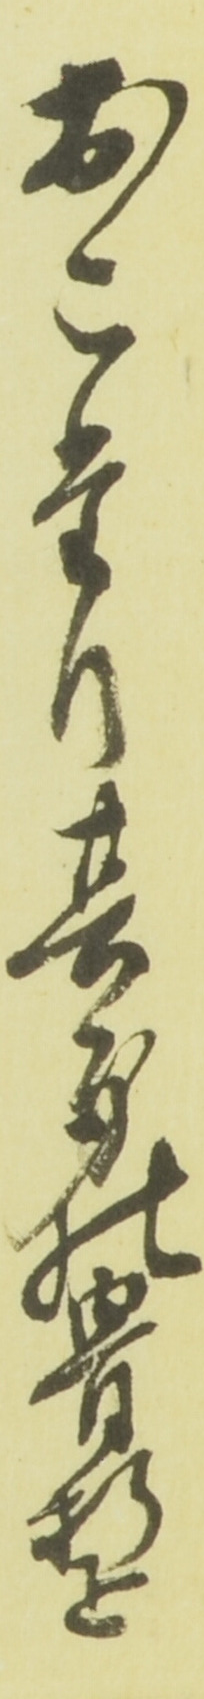おこたり其身の骨折を
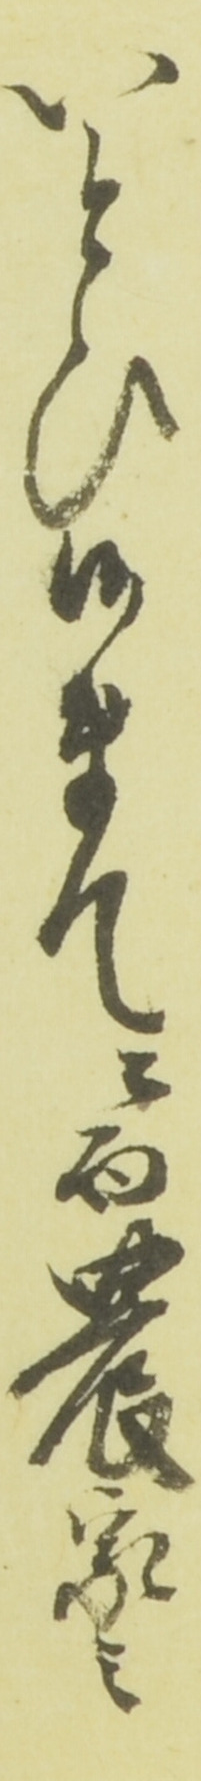いとひ候まてニ而農家之
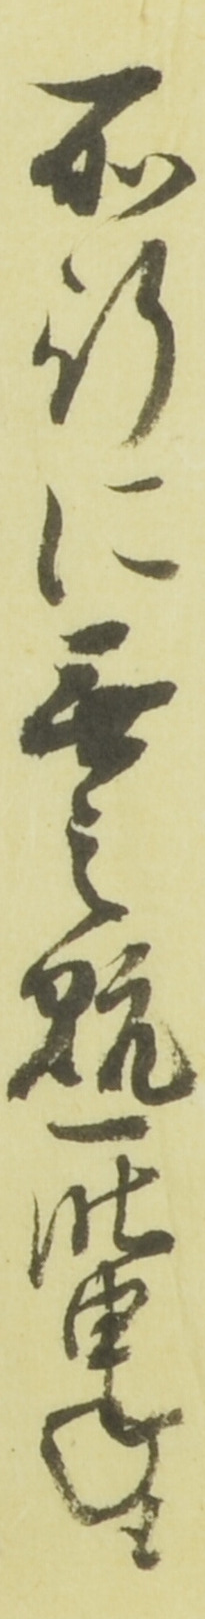所行に無之既一昨申年も
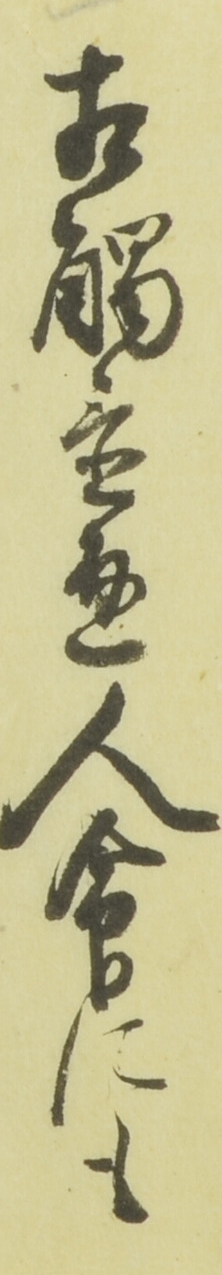相触置通人命にも
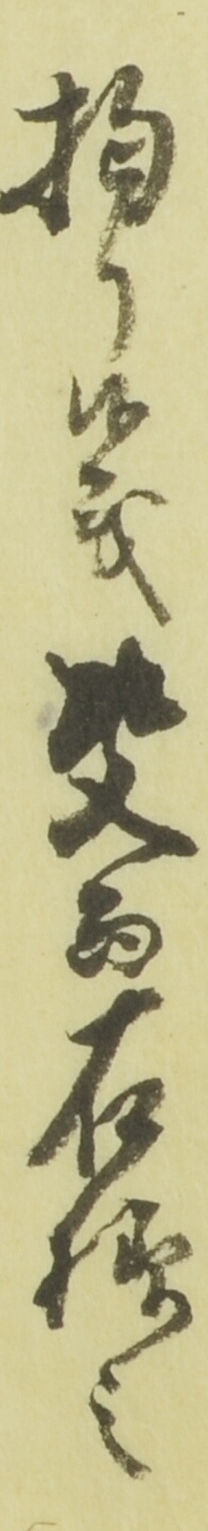拘り候義決而右様之
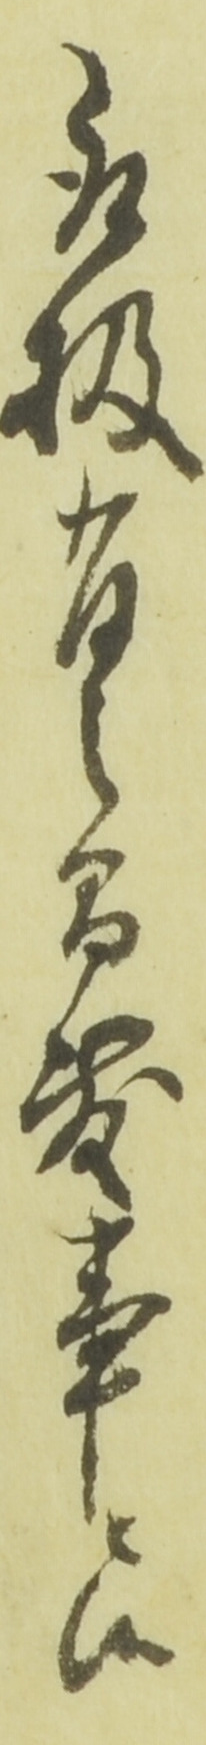取扱有之間敷事ニ候
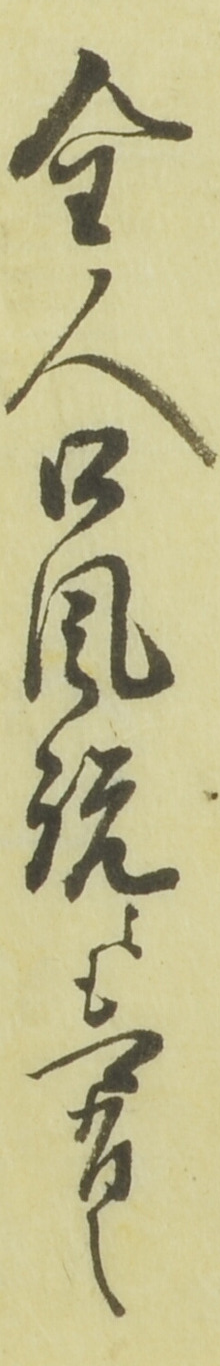全人口風説ニも可有之
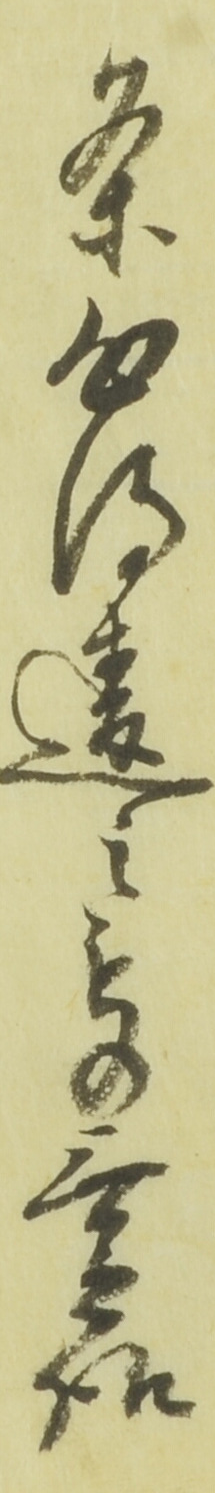条心得違之もの無之様
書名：御触書御書附控
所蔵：伊那市立高遠町図書館・合同会社AMANE
